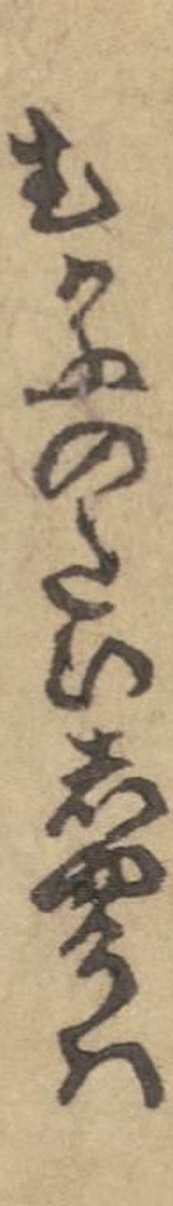むかふのたいしやうは
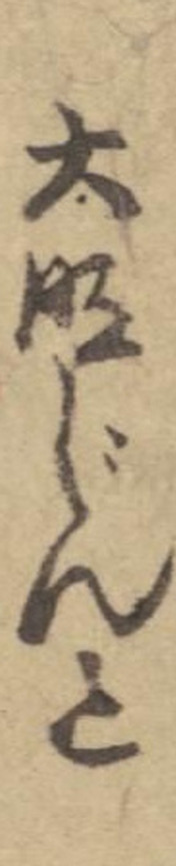大明じんと
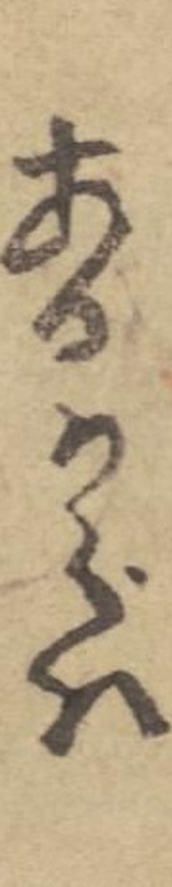あるからは
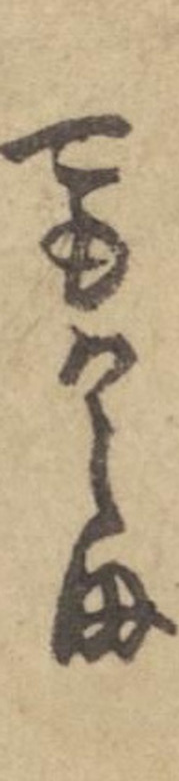てもかしま
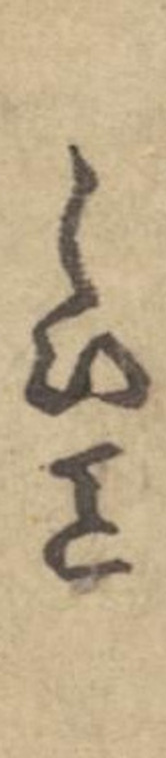しいこと
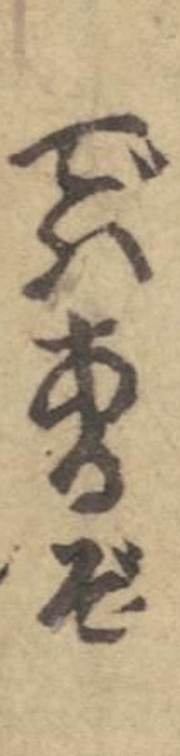ではあるぞ
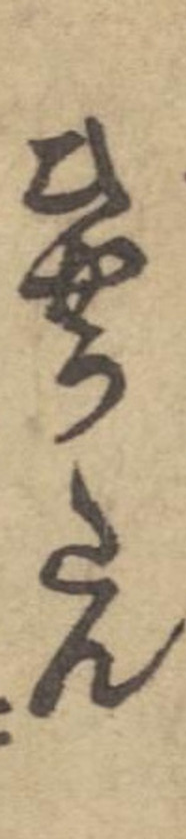ひやうたん
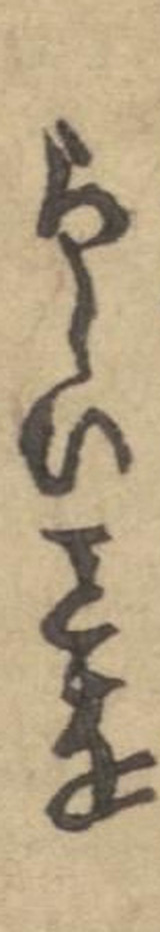らしいことを
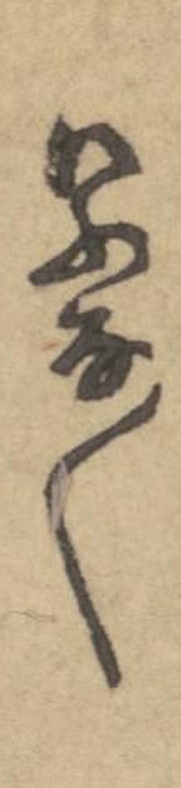いふな〳〵
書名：入用御間商賣競
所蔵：東京大学地震研究所図書室 Earthquake Research Institute Library, The University of Tokyo, JAPAN
